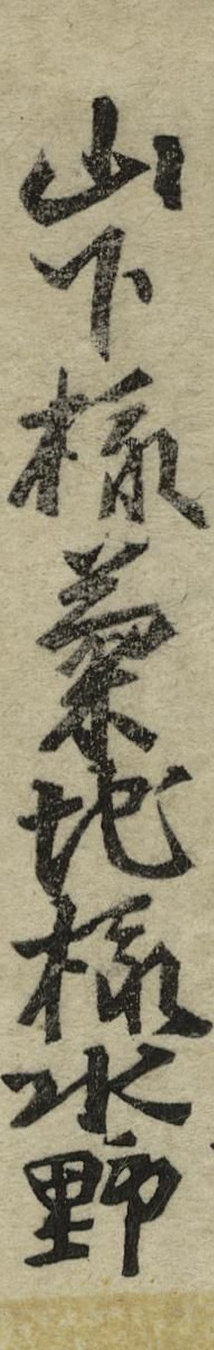山下様菊地様水野
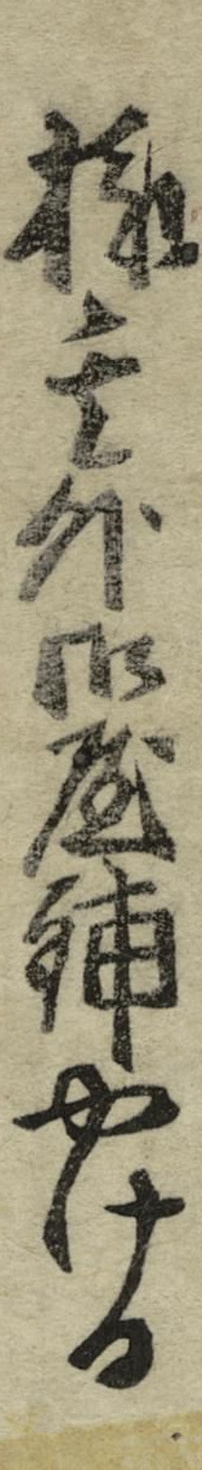様其外御屋舗やける
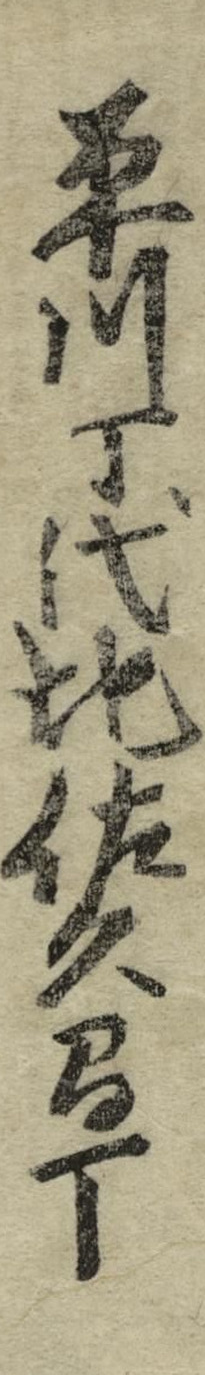平川丁代地佐久間丁
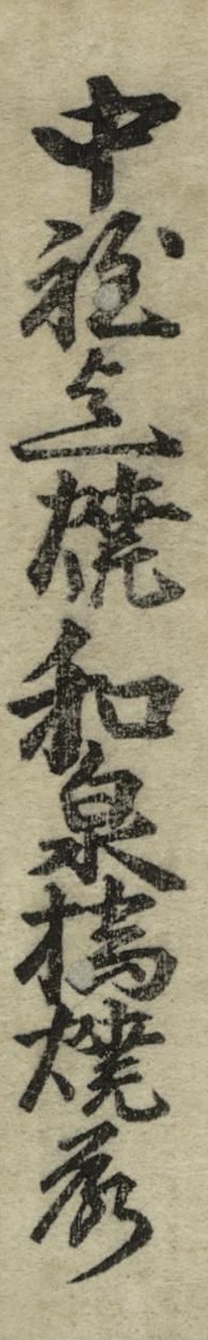中程迄焼和泉橋焼落
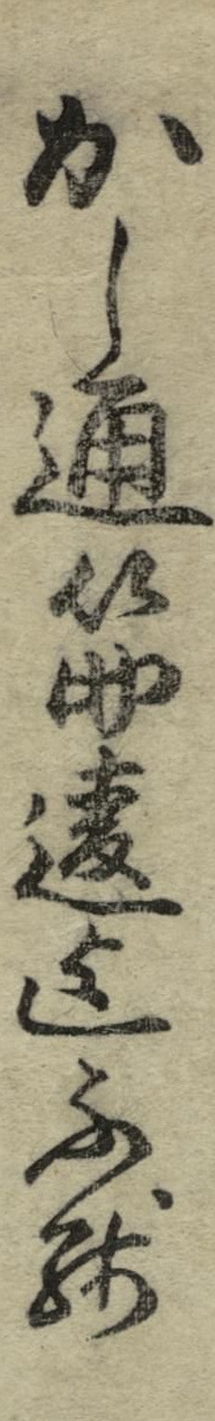かし通筋違迄不残
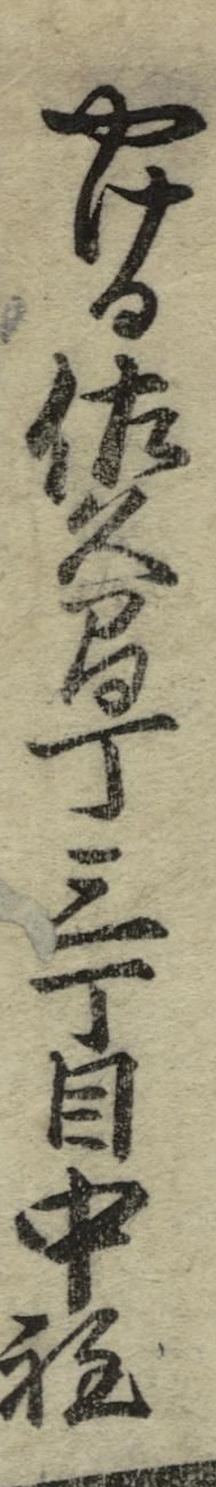やける佐久間丁三丁目中程
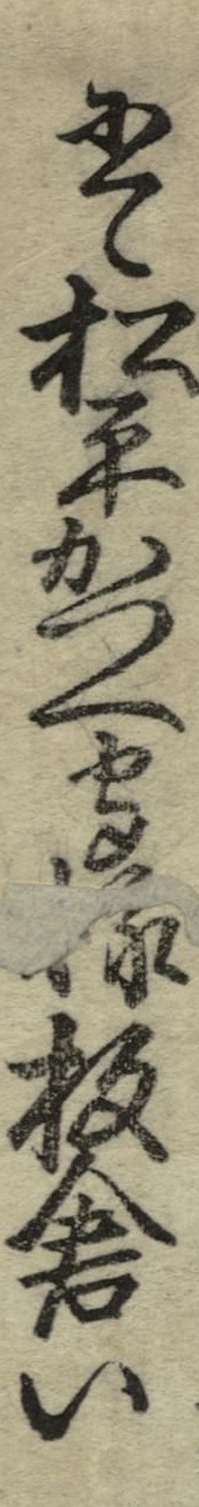にて松平かつへ守様板倉い
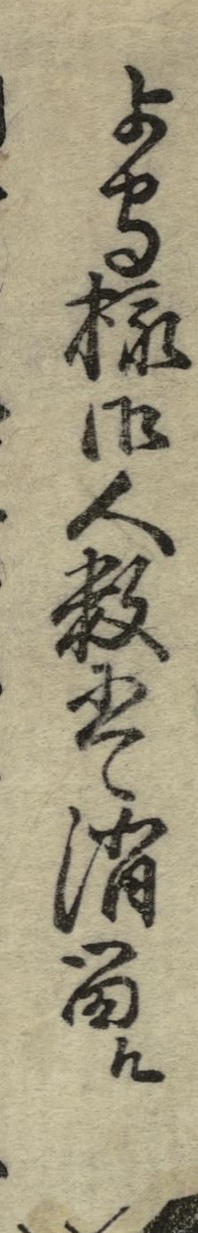よ守様御人数にて消留ル
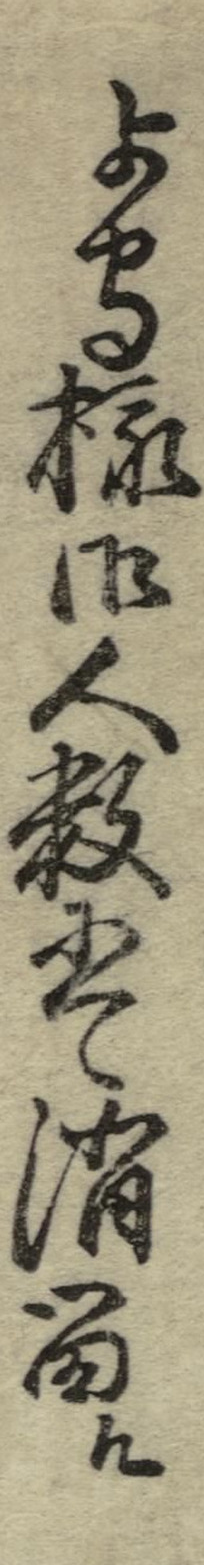よ守様御人数にて消留ル
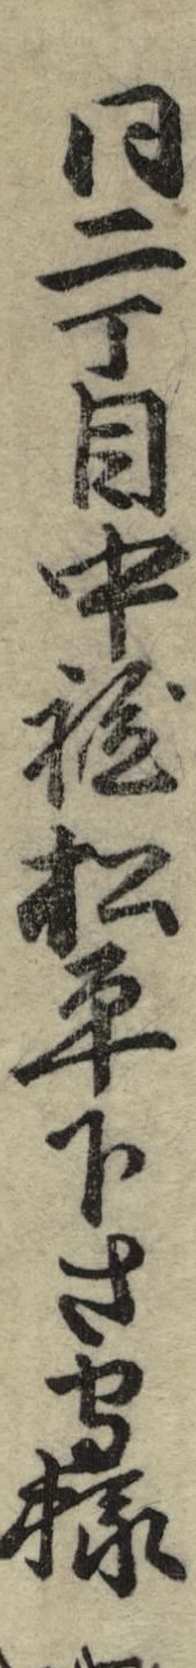同二丁目中程松平下さ守様
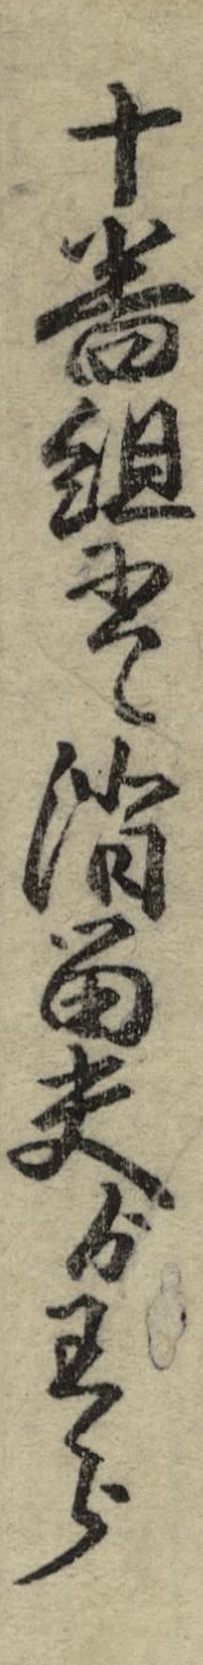十番組にて消留夫ゟわら
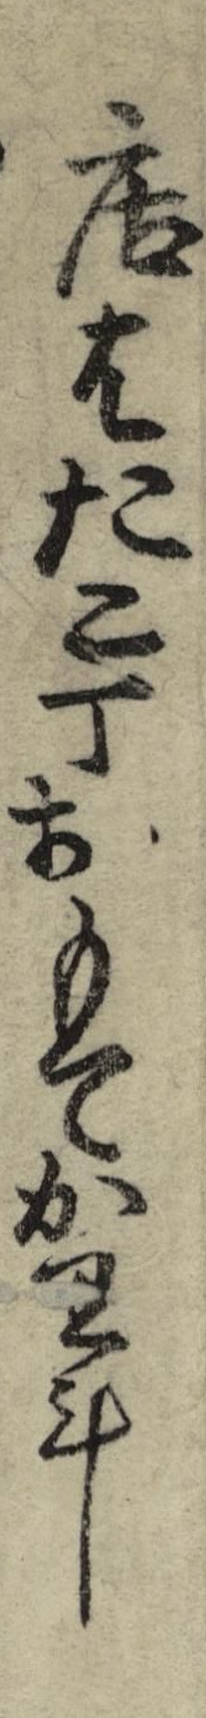店はたこ丁おもてかわ斗
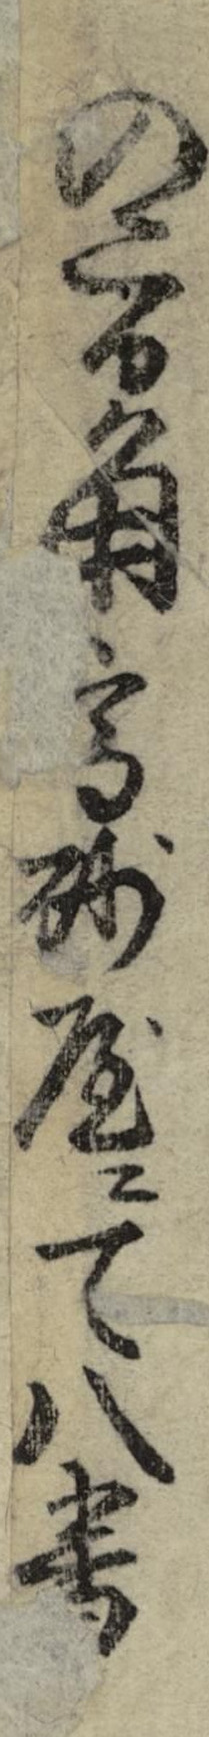のこる角高砂屋にて八番
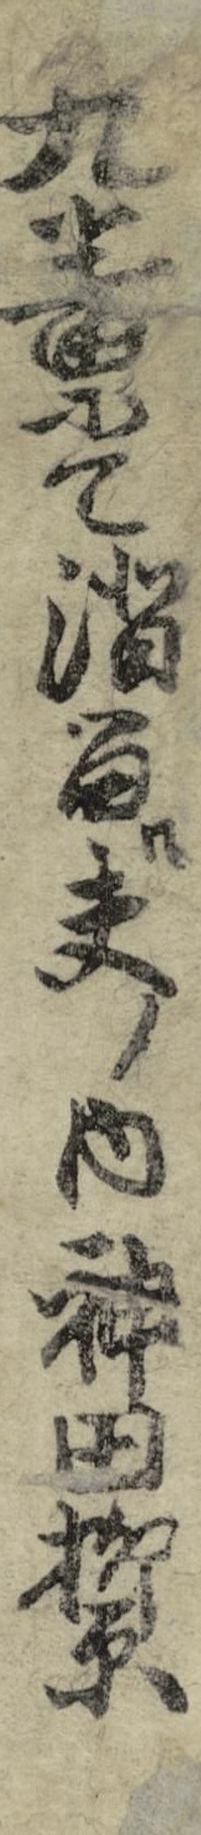九番にて消留ル夫ノ内神田柳原
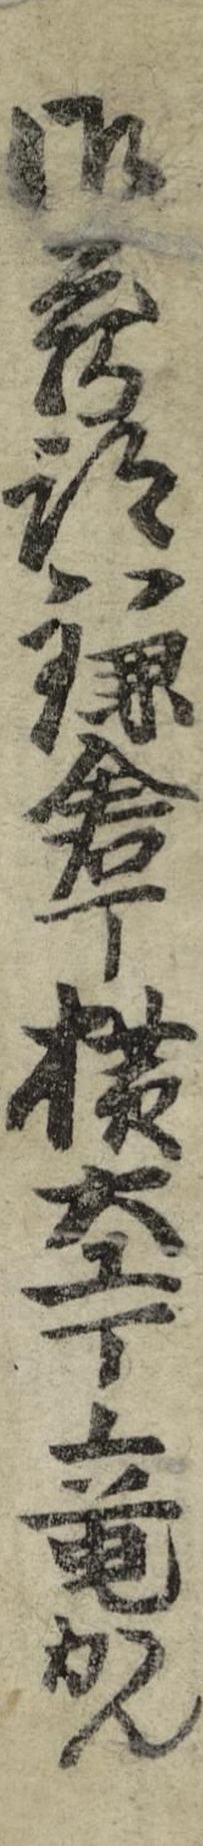御蔵跡鎌倉丁横大工丁竜かん
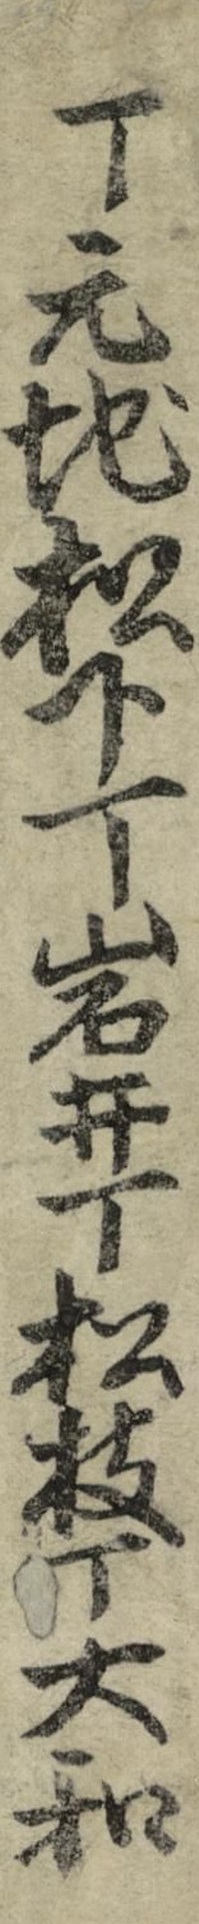丁元地松下丁岩井丁松枝丁大和
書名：安政五午十一月十五日焼場方角附
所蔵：東京大学地震研究所図書室 Earthquake Research Institute Library, The University of Tokyo, JAPAN
